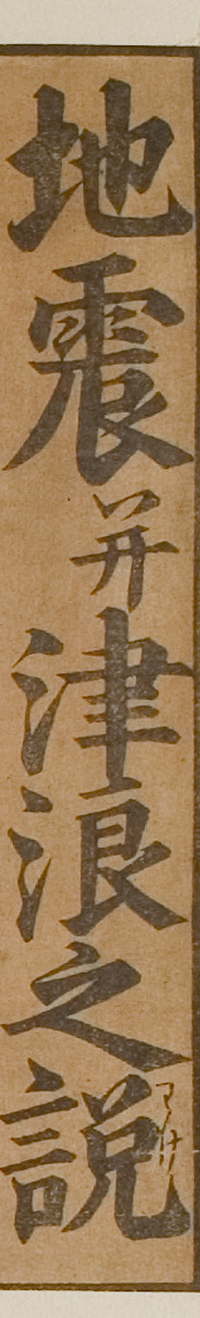地震幷津浪之説
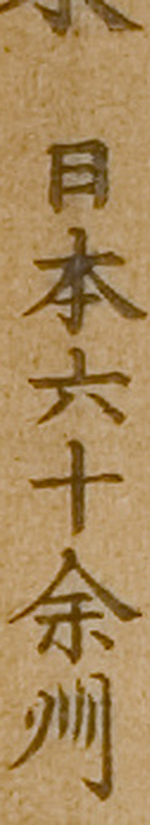東日本六十余州西
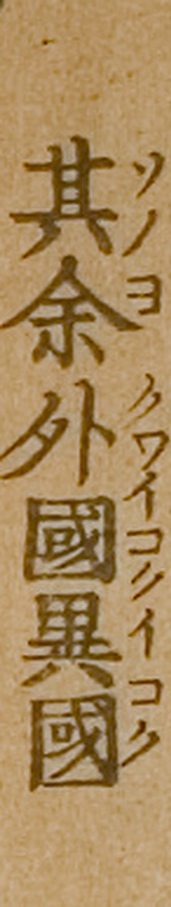其余外国異国
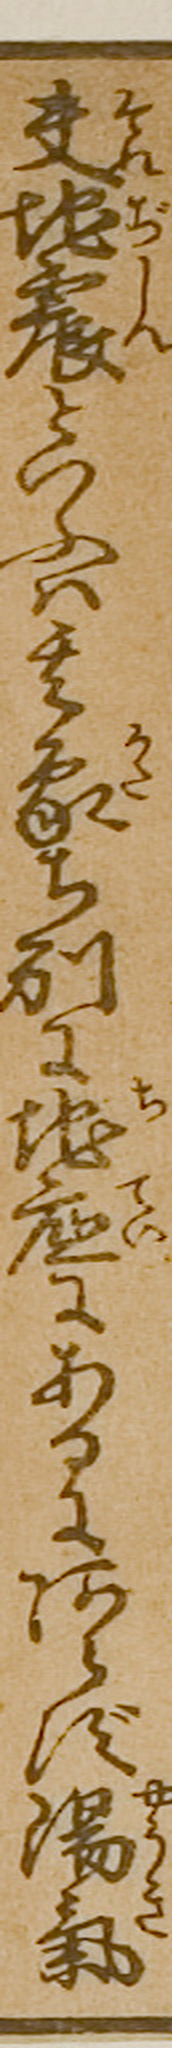夫地震といふは其象ち別に地底にあるにあらず陽気
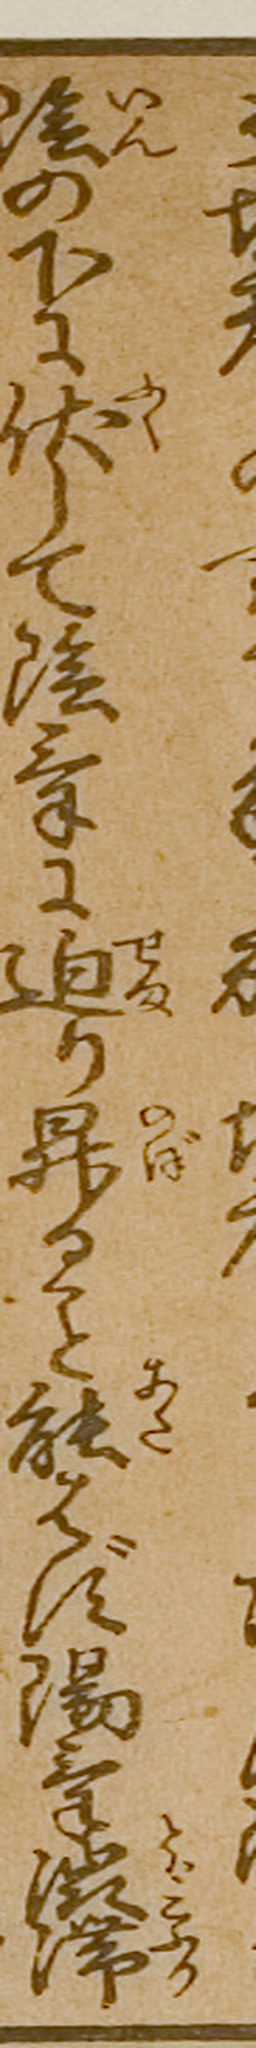陰の下に伏して陰気に迫り昇ること能はず陽気渋滞て
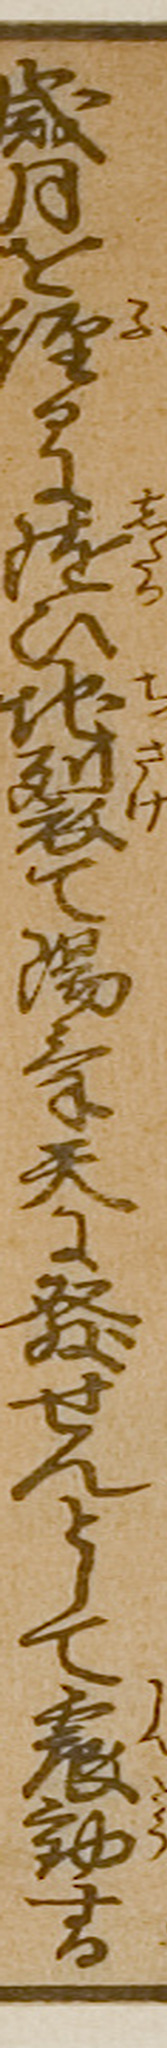歳月を経るに従ひ地裂て陽気天に発せんとして振動する
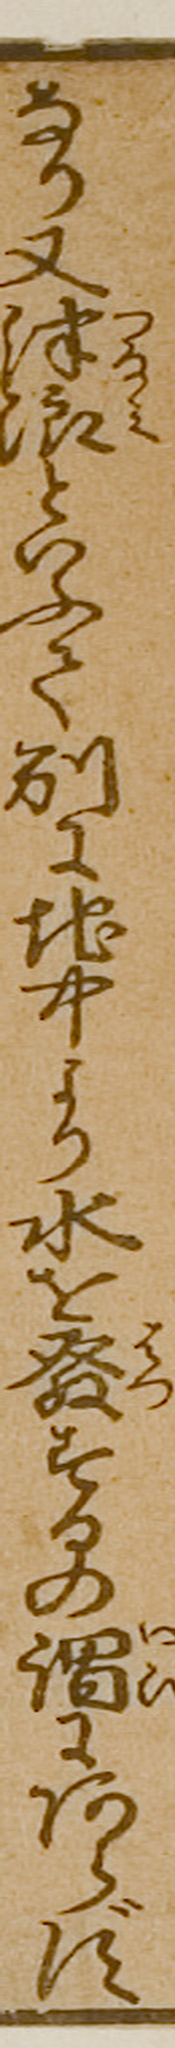なり又津浪といふて別に地中より水を発するの謂にあらず
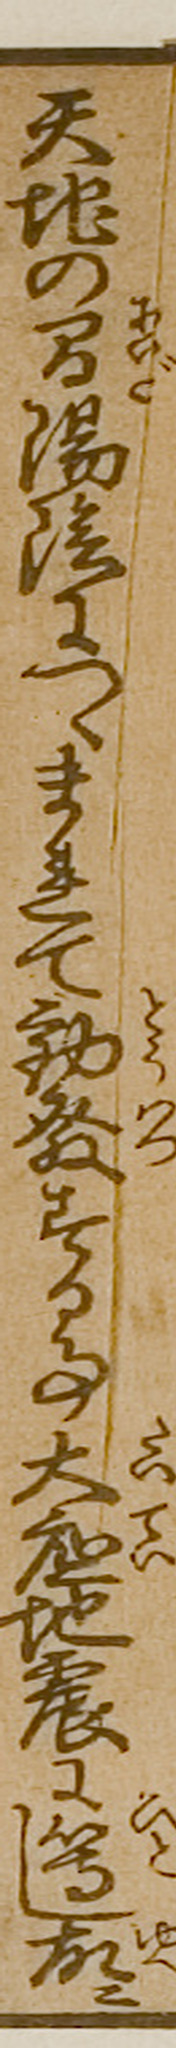天地の間陽陰につゝまれて動発する事大底地震に等し故に
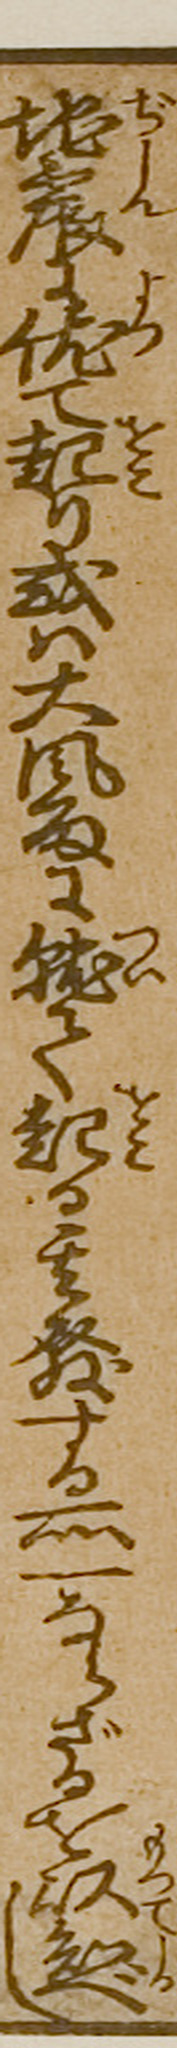地震に依て起り或は大風雨に就て起る其発する所一ならざるを以知べし
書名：地震并津浪之説
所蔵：東京大学総合図書館 General Library in the University of Tokyo, JAPAN
